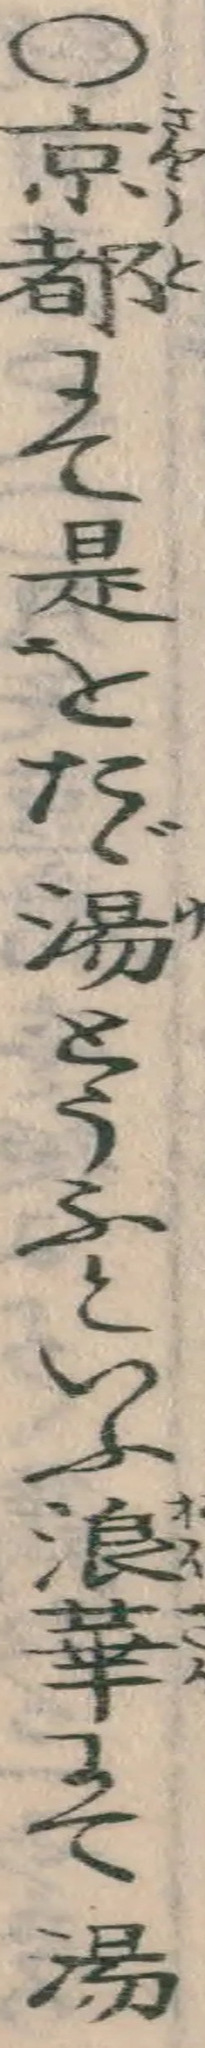○京都にて是をたゞ湯とうふといふ浪華にて湯
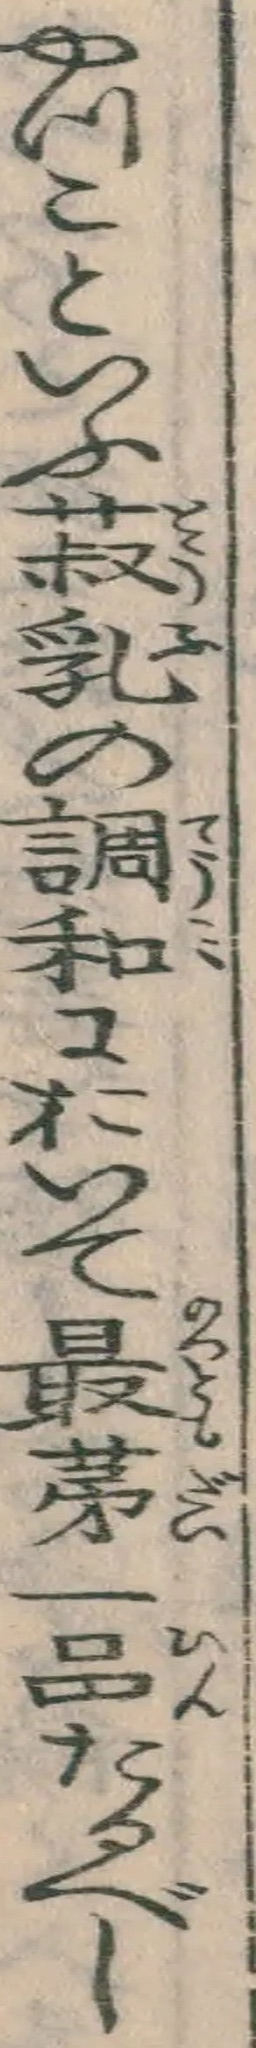やつこといふ菽乳の調和において最第一品たるべし
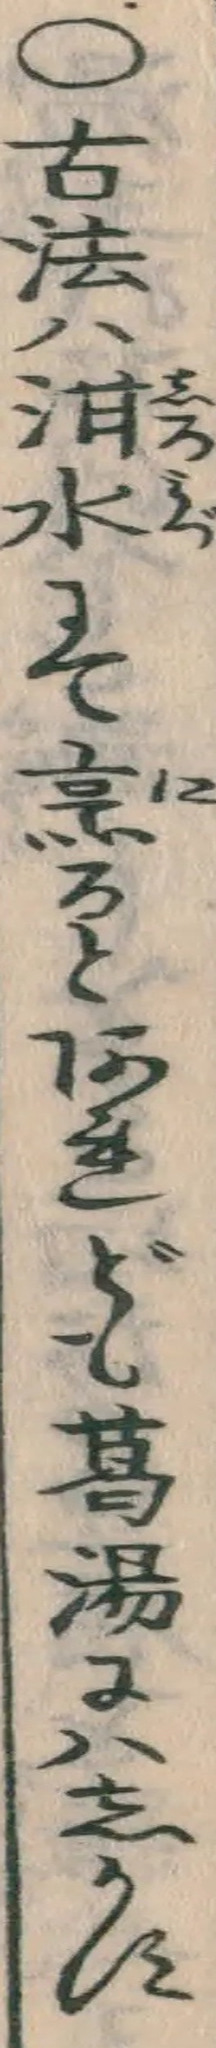○古法は泔水にて烹るとあれども葛湯にはしかす
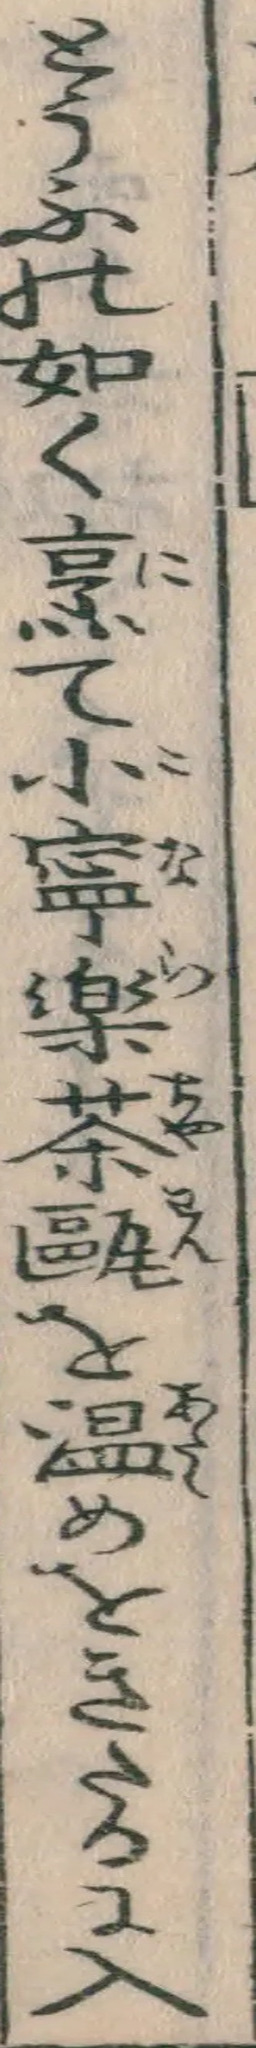とうふの如く烹て小寧楽茶甌を温めをきたるに入
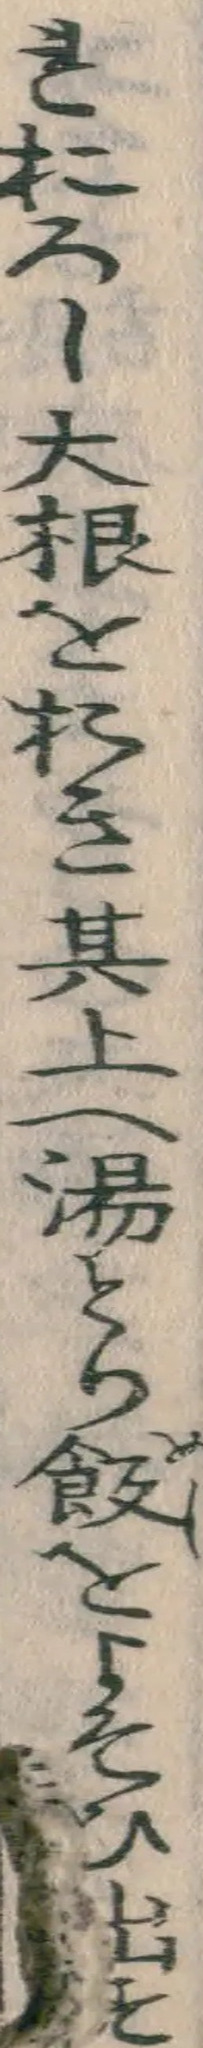れおろし大根をおき其上へ湯とり飯をよそひ出す
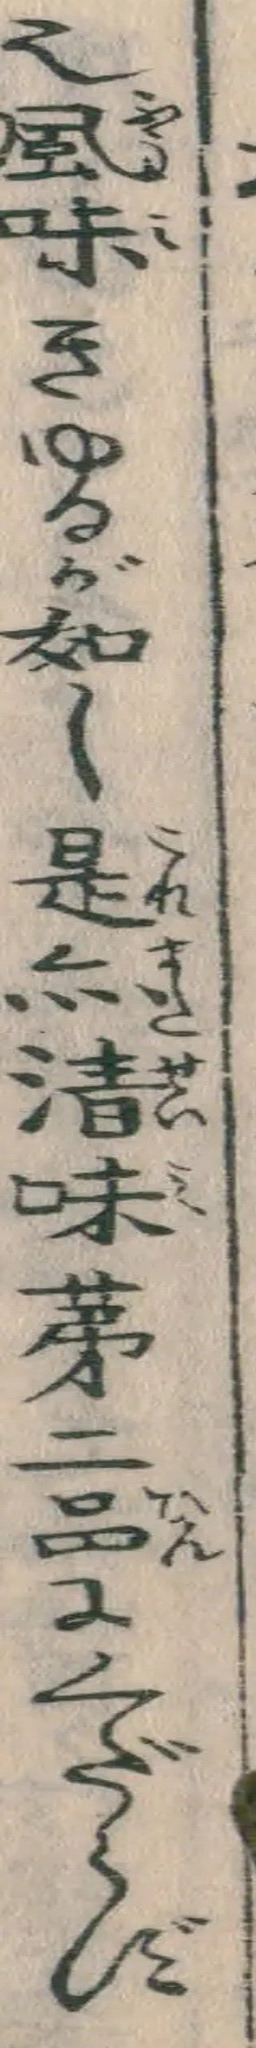也風味きゆるが如し是亦清味第二品にくだらず
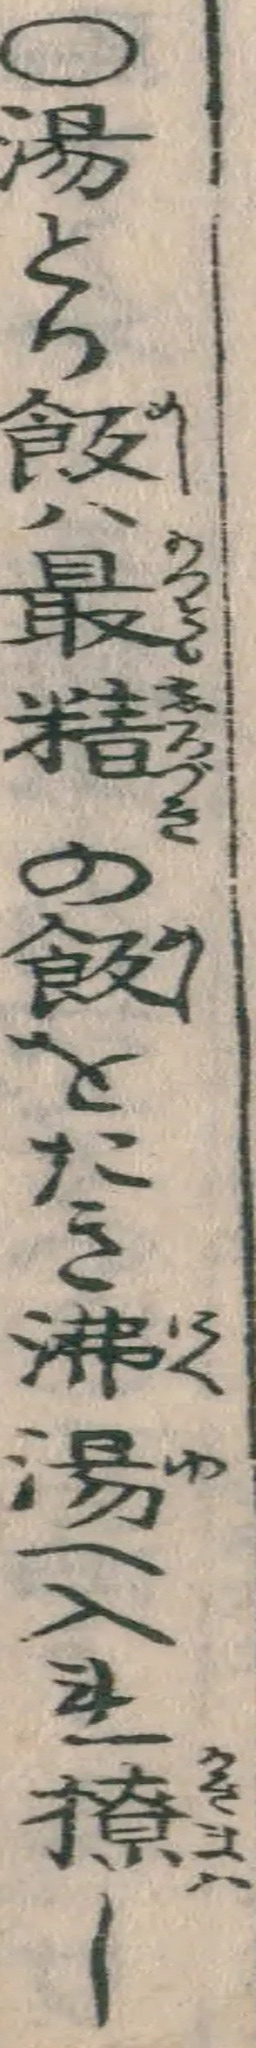○湯とり飯は最精の飯をたき沸湯へ入れ撩し
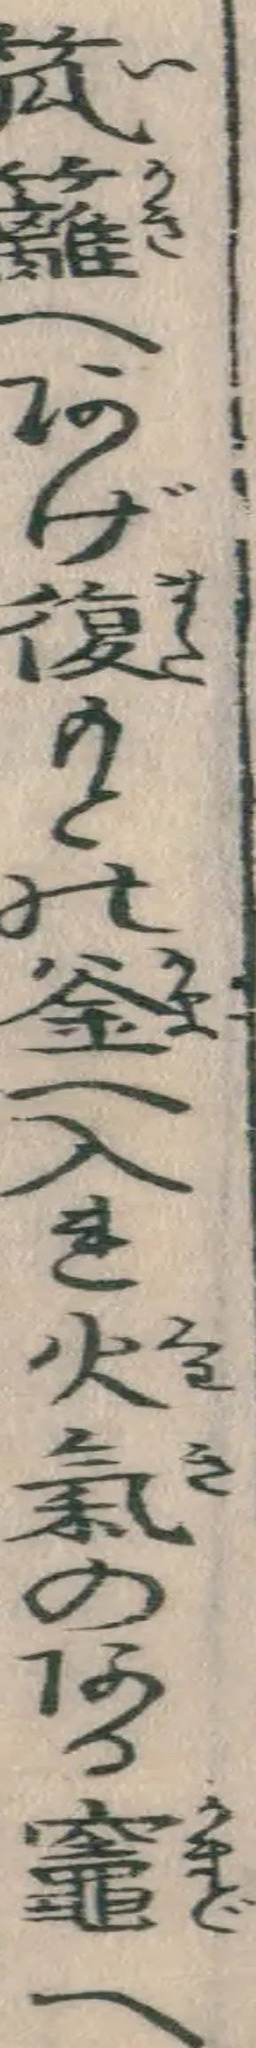笟籬へあげ復もとの釜へ入れ火気のある竈へ
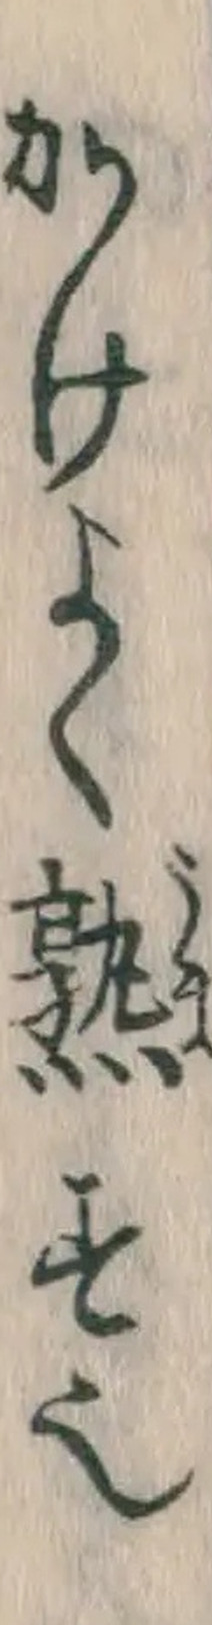かけよく熟す也

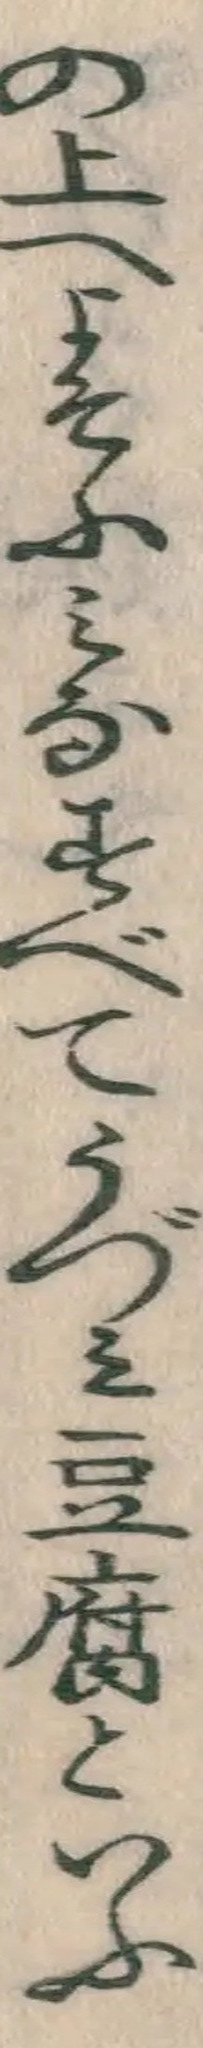の上へよそふみなすべてうづみ豆腐といふ
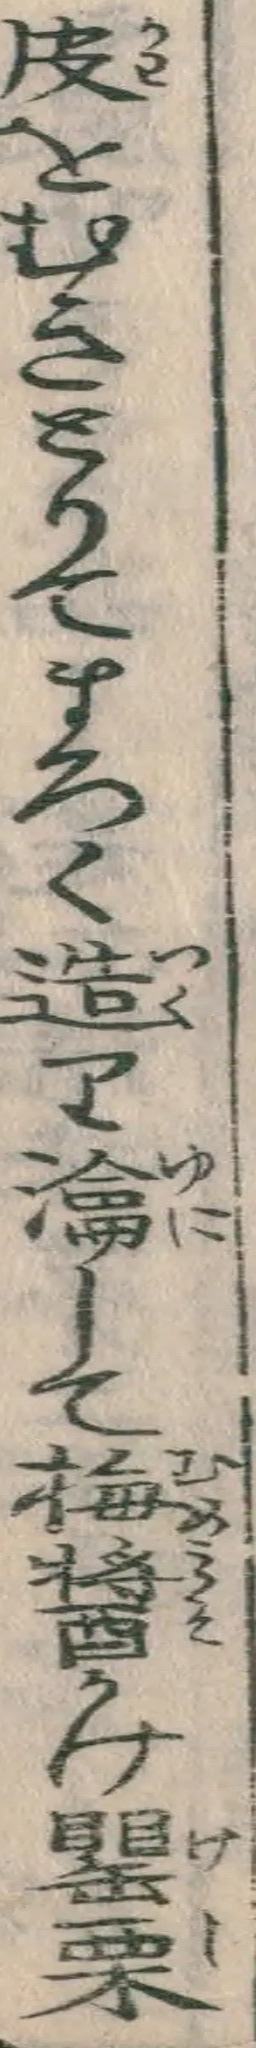皮をむきとりてまろく造り瀹して梅醤かけ罌粟
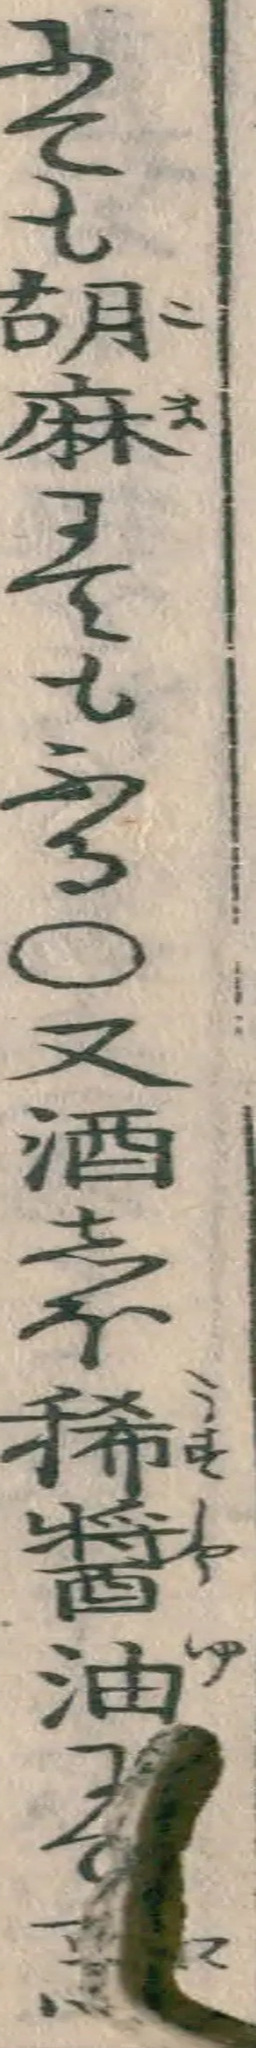にても胡麻にてもふる○又酒しほ稀醤油にて烹
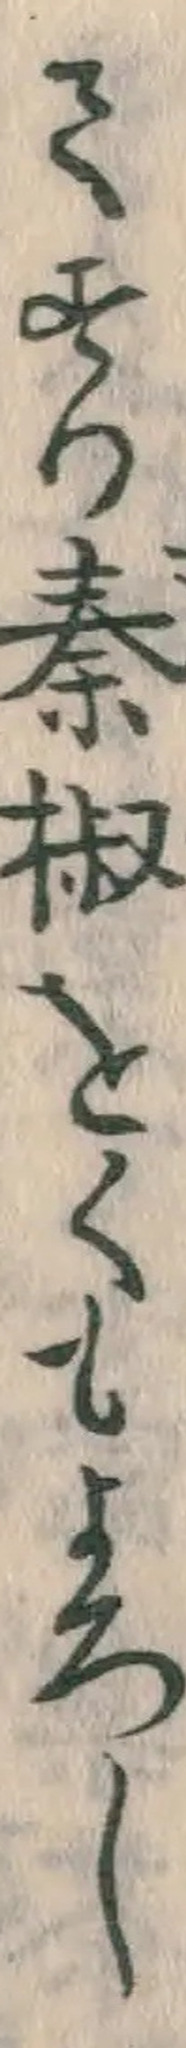てすり泰椒をくもよろし
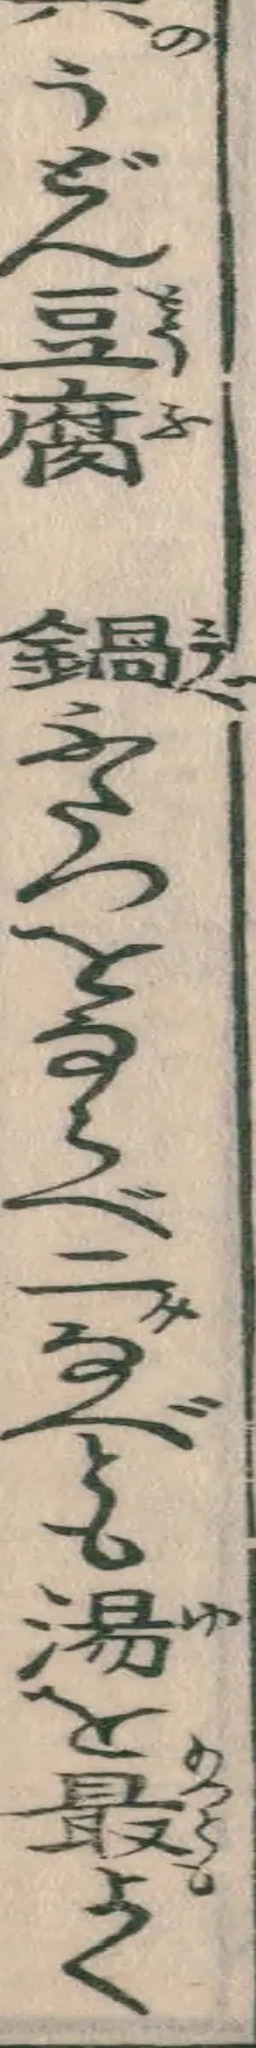[百]眞うどん豆腐鍋ふたつをならべ二タなべとも湯を最よく
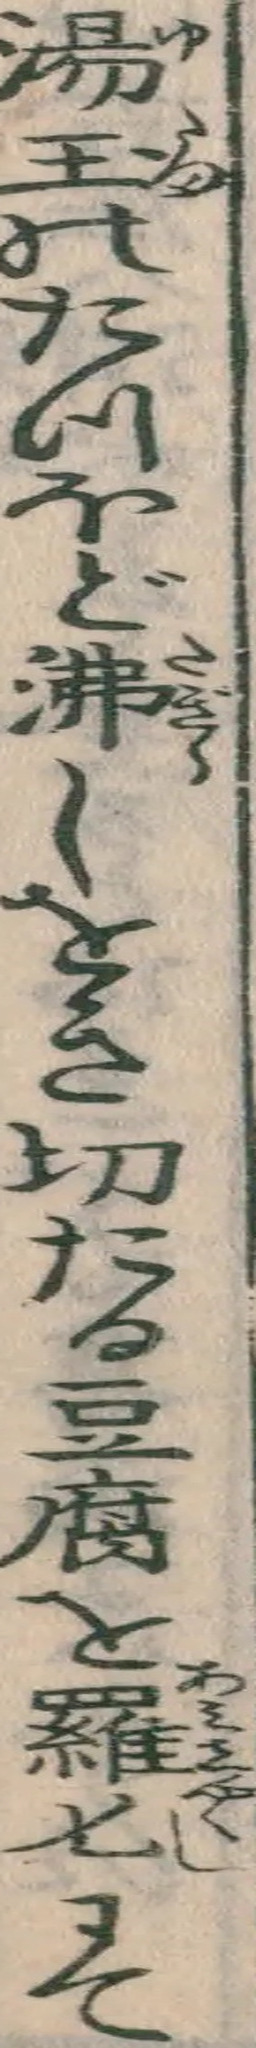湯玉のたつほど沸しをき切たる豆腐を羅七にて
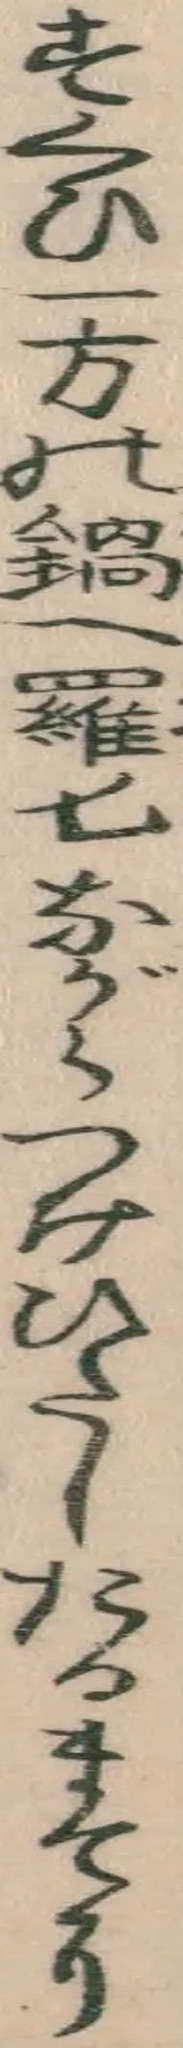すくひ一方の鍋へ羅七ながらつけひたしたるまてけり
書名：豆腐百珍. [正編]
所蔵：国立国会図書館 National Diet Library, JAPAN
